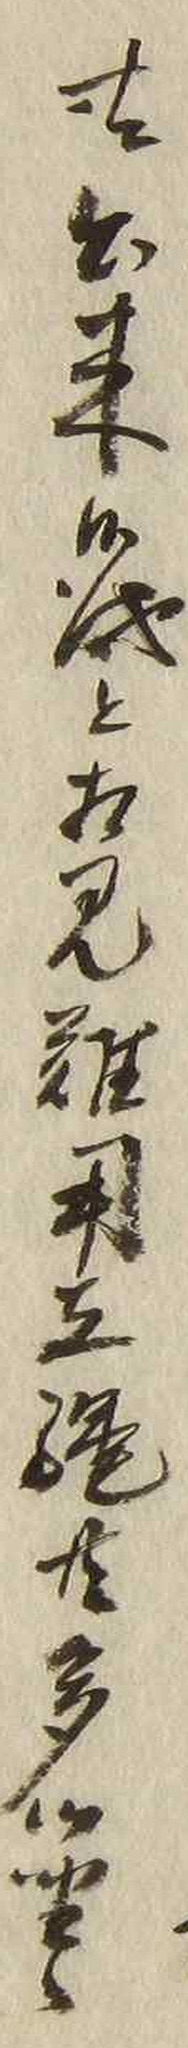戒出来候儀と相見難用立縄共多御座候

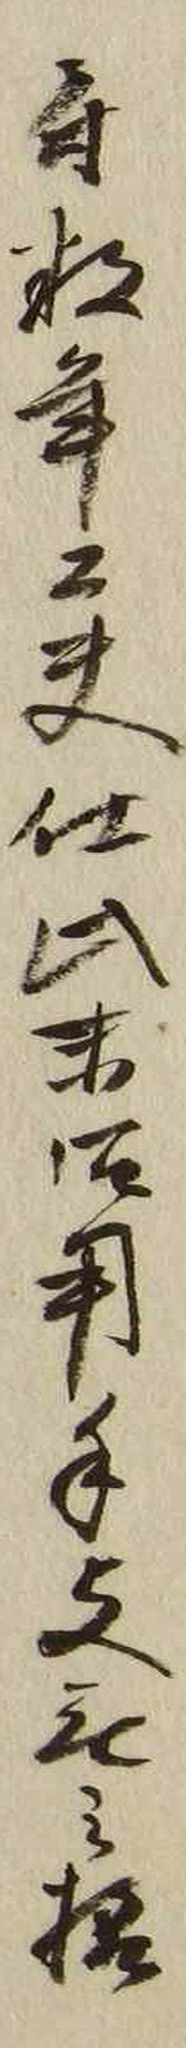に付数年工夫仕此末御用手支無之様
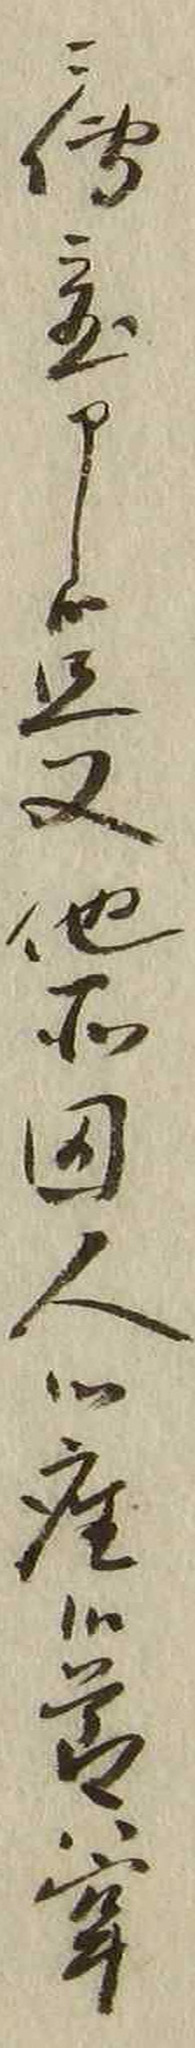に伝置申候且又他所囚人御座候節は牢
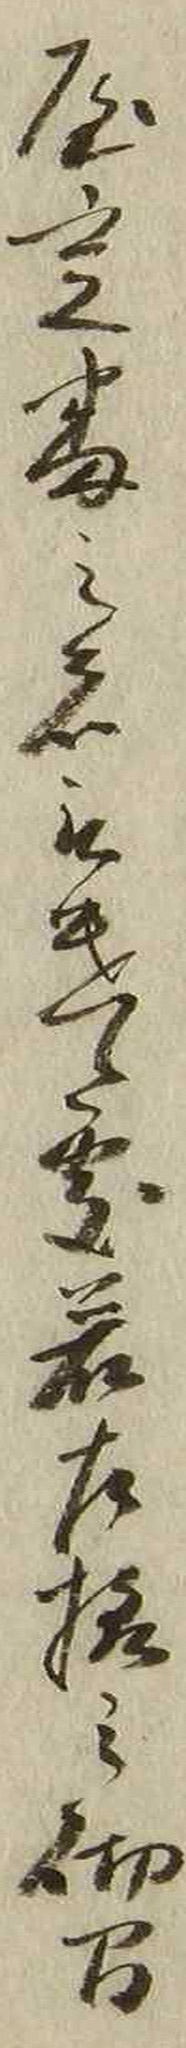屋定番之者被遣可候処若左様之砌間
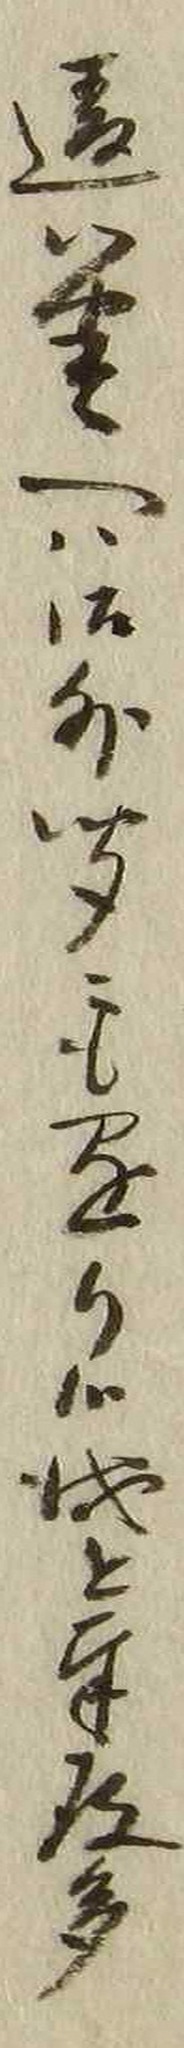違御座候へは御外聞にも懸り候儀と奉存多
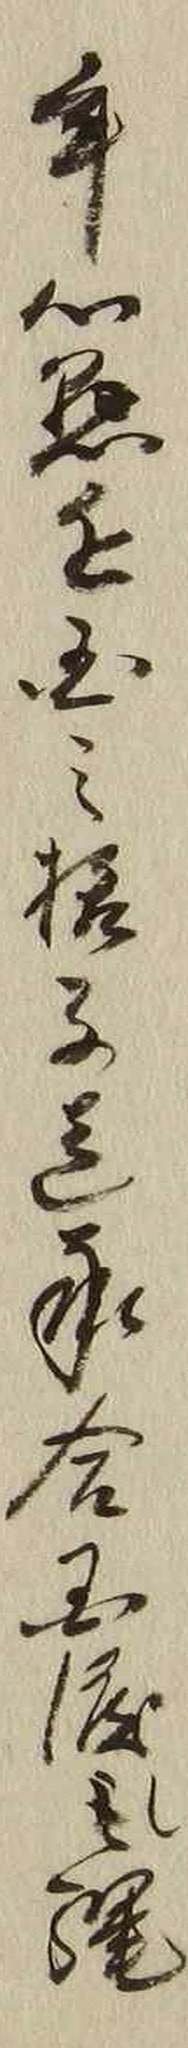年心懸近国之様子迄承合国渡之縄
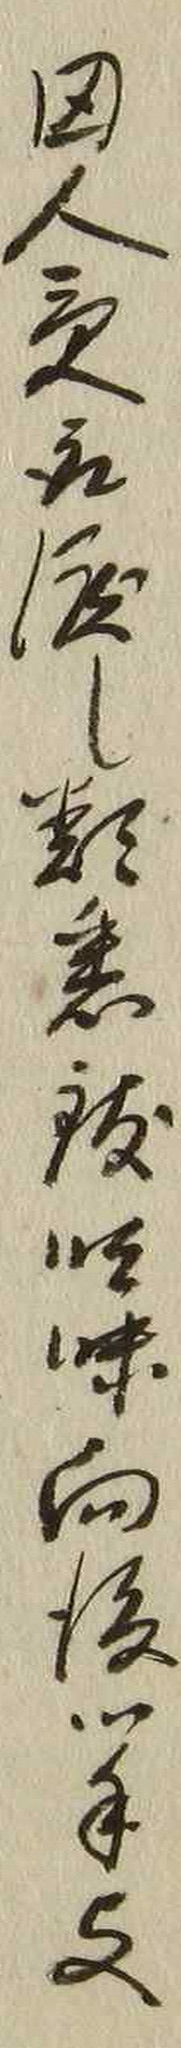囚人受取渡し類悉致吟味向後御手支
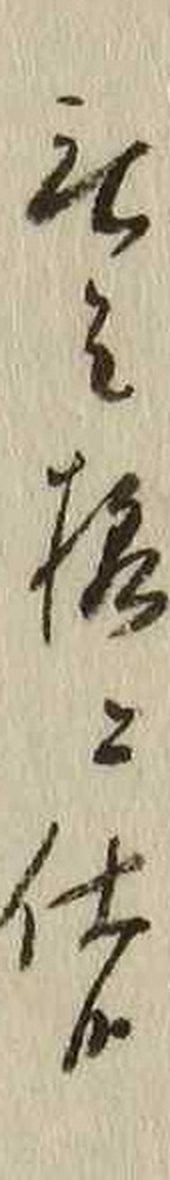無之様に仕候
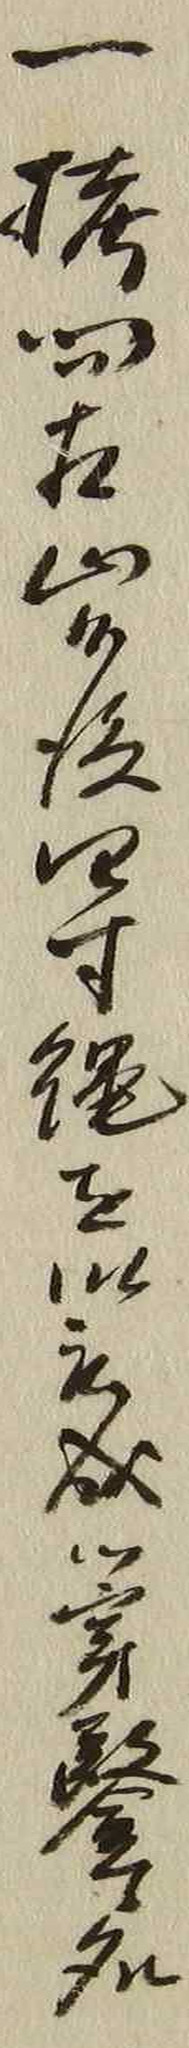一拷問相止以後四寸縄を以被成御穿鑿候処
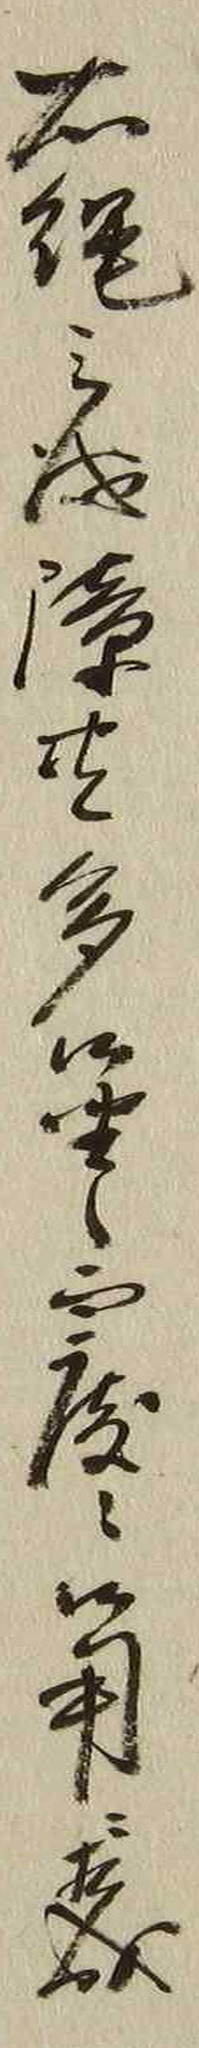右縄之儀障共多候由に而度々御用に相成
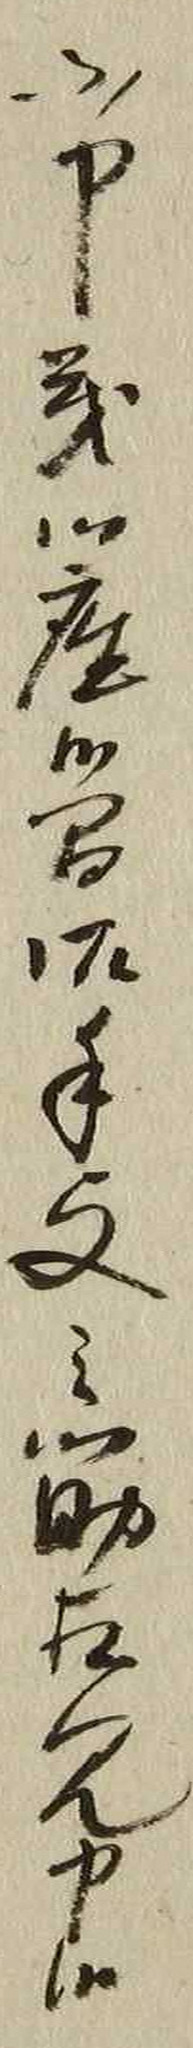不申義御座候間御手支之筋相見申候
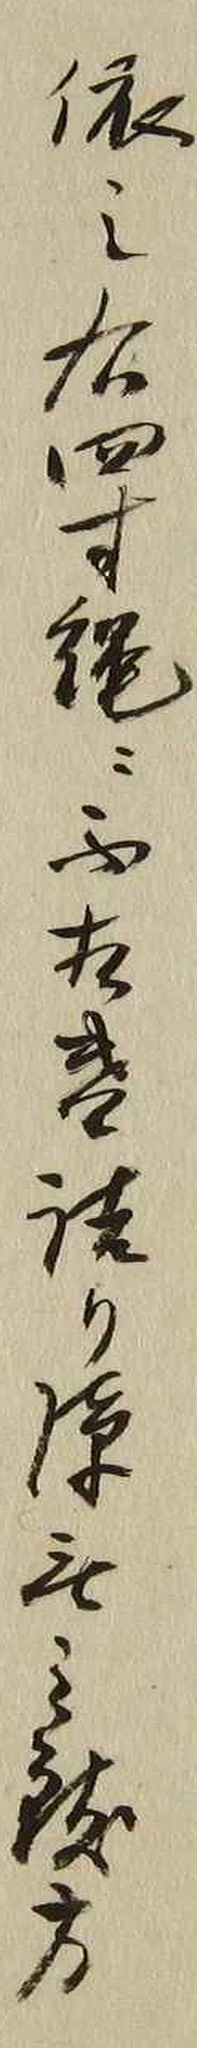依之右四寸縄に不相替詰り障無之致方
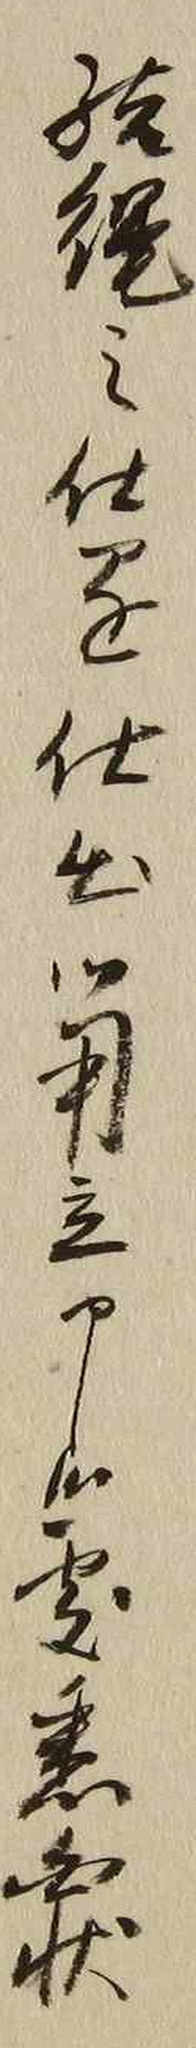結縄之仕懸仕出御用立申候処悉白状
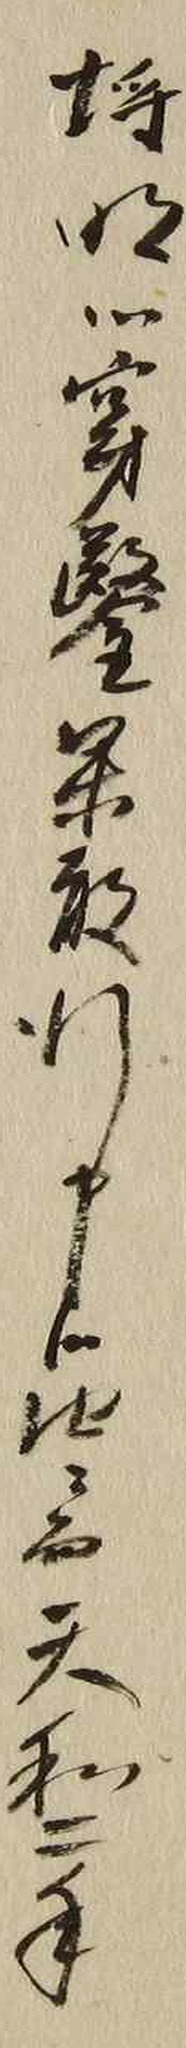埒明御穿鑿果敢行申候由に而天和二年
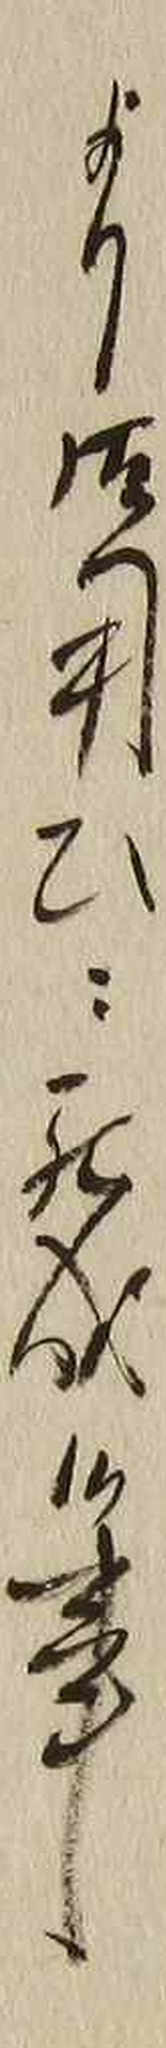より御用ひに罷成候事
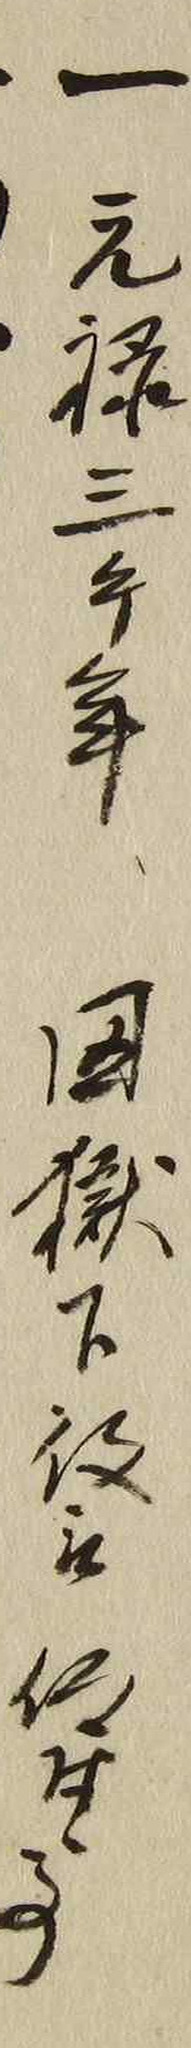一元禄三午年囚獄下役被仰付候事
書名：諸士系譜　巻之360　す之部10
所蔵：会津若松市立会津図書館
